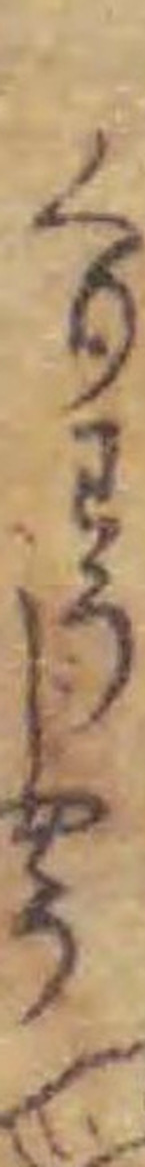くりわうじやう

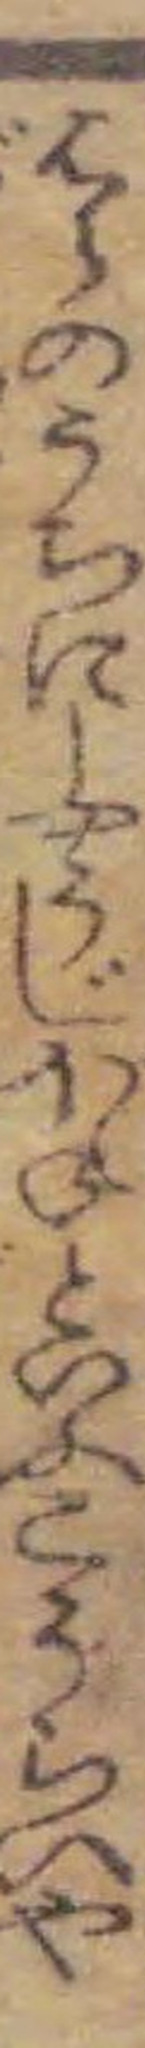はらのうちにしやうじぼねといふこうらいや
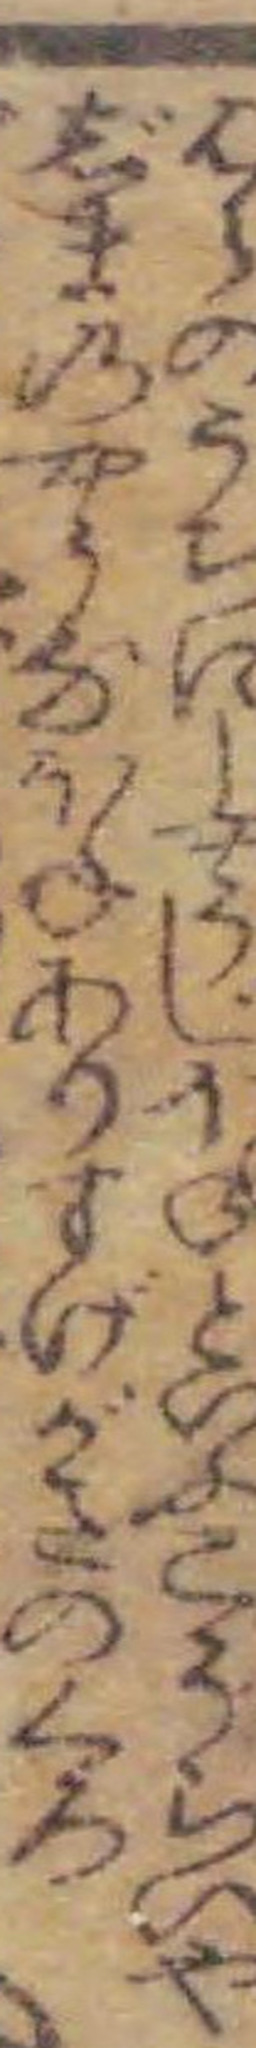じまのやうなほねありすげがさのくろ
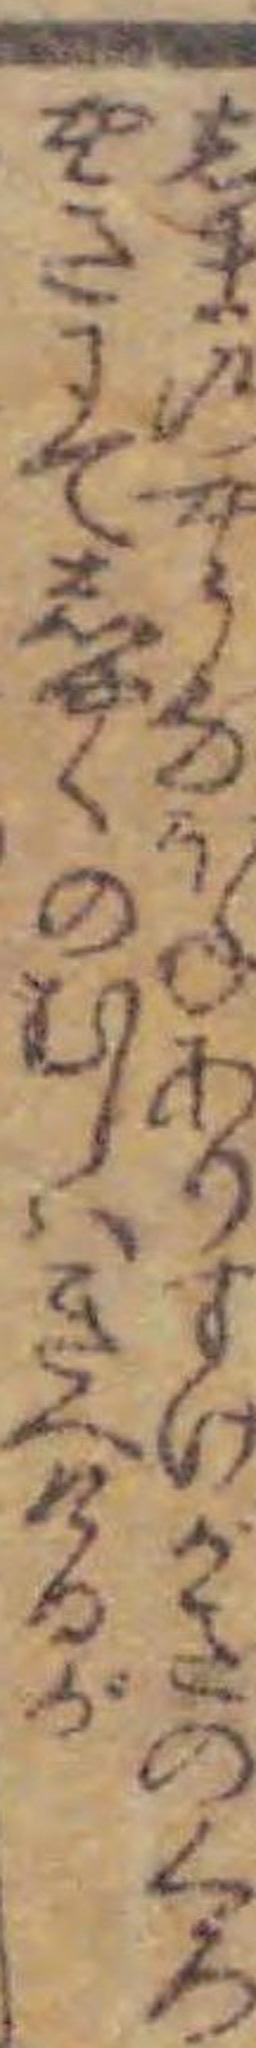やきにてしやくのむしはきへけるが
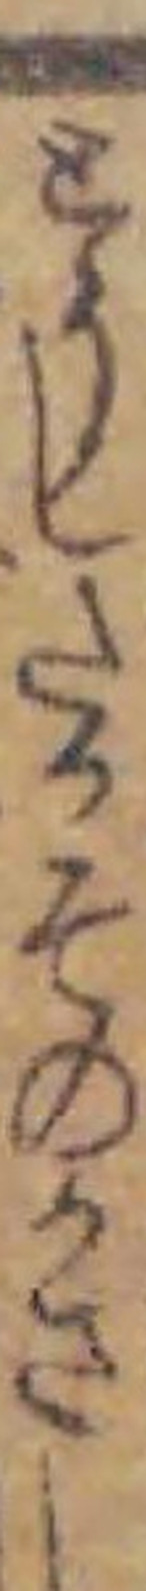とうしたかそのかさ
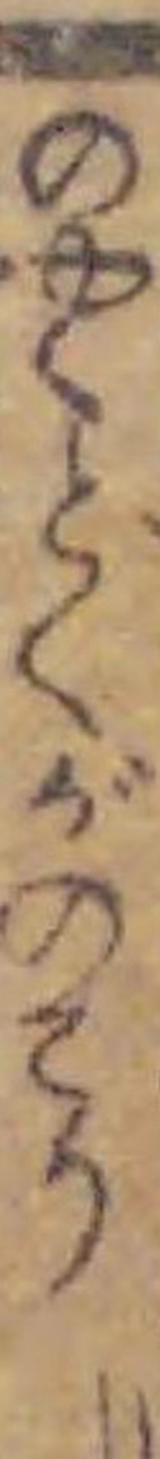のやくとくがのこり
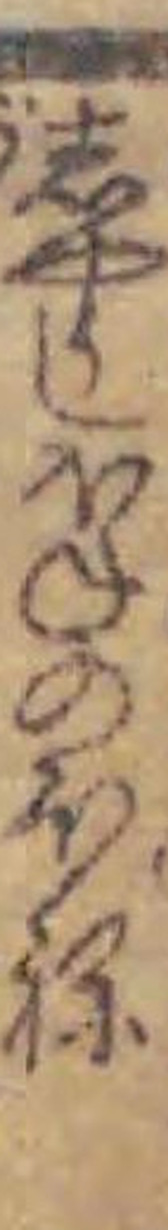しやうしほねのほね
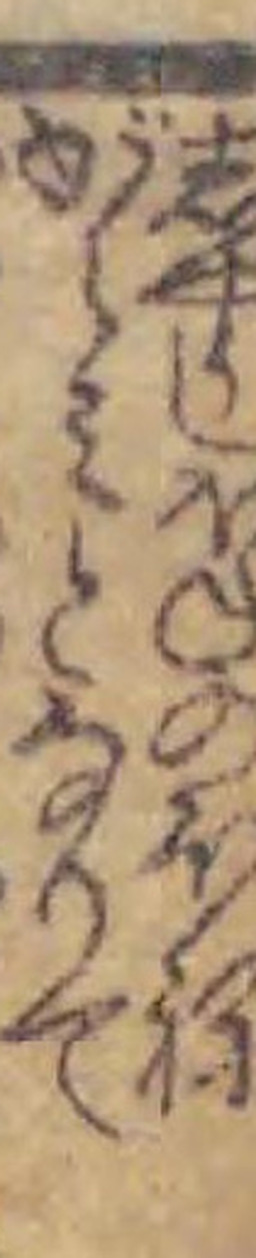がらみとなりて
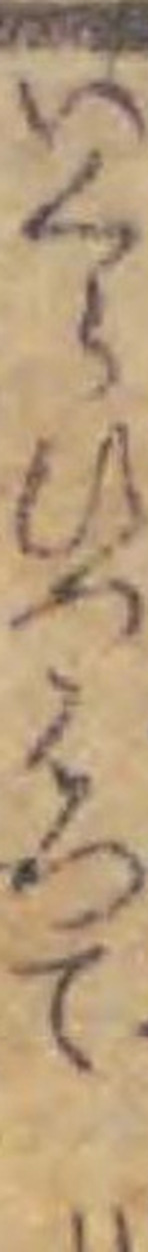いくらひつはつて
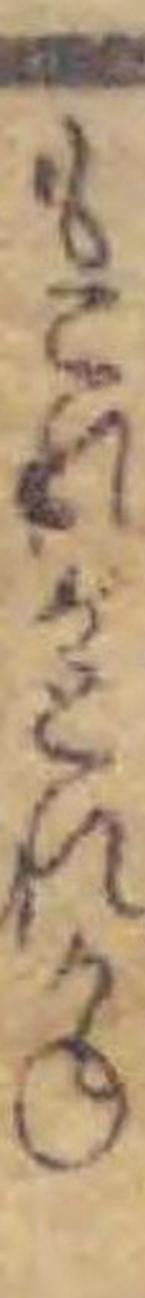もこれがとれかね
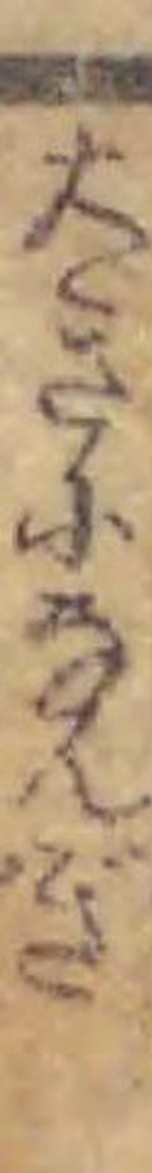大きになんぎ
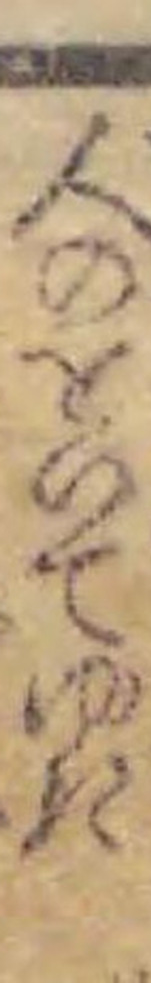人のをいてゆき
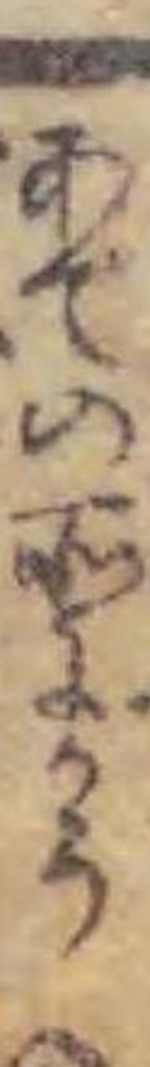あての所にかう
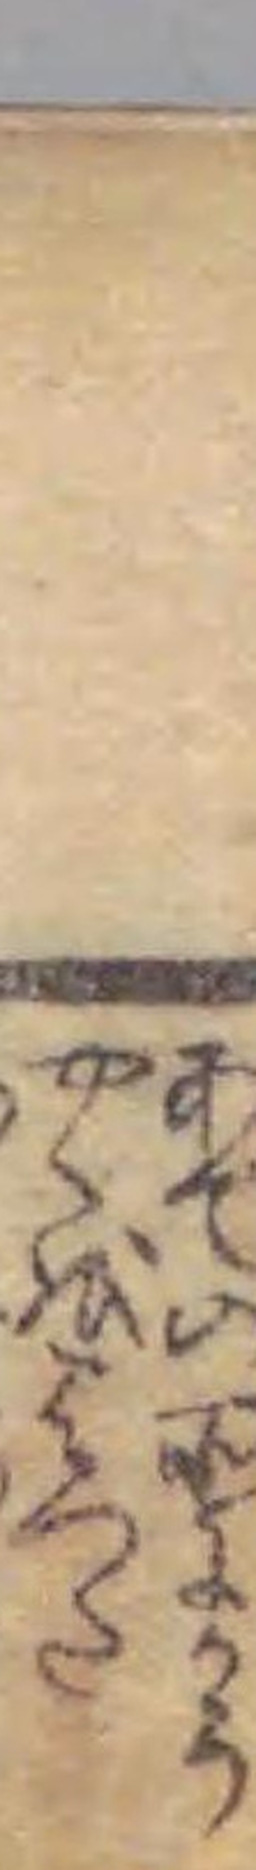やくをはつた
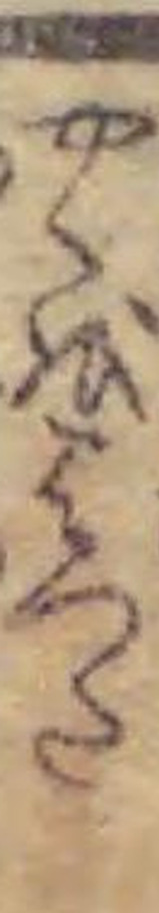やくをはつた
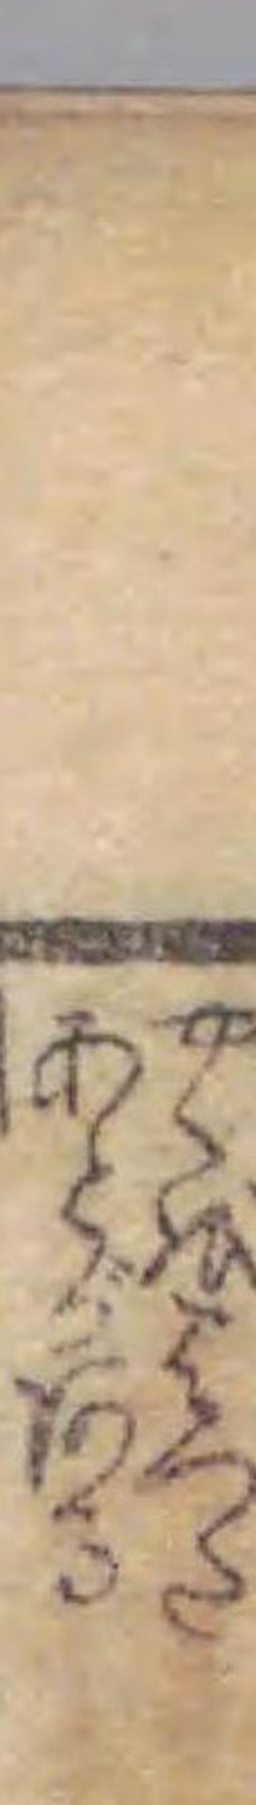あとがある
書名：十四傾城腹之内 : 3巻
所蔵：国立国会図書館 National Diet Library, JAPAN
